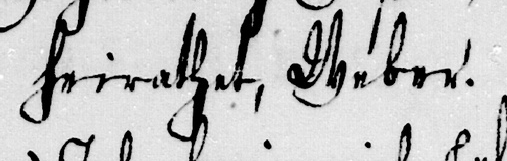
rheirathet, Weber.
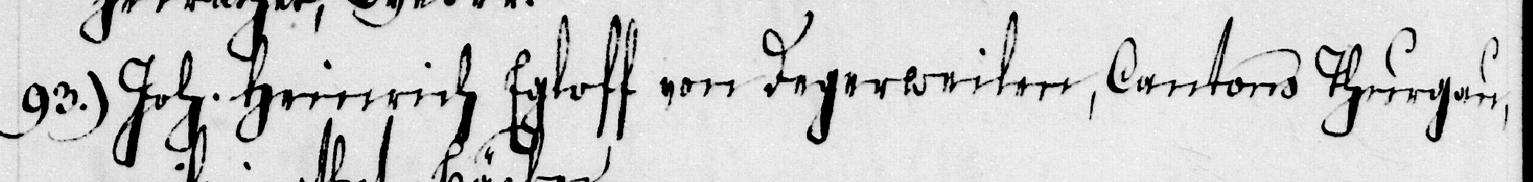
93.) Joh. Heinrich Egloff von Degerweiler, Cantons Thurgau,
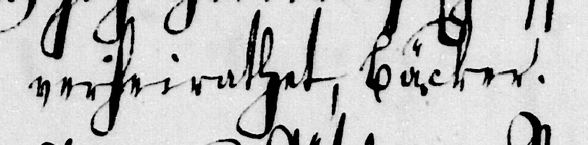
verheirathet, Bäcker.
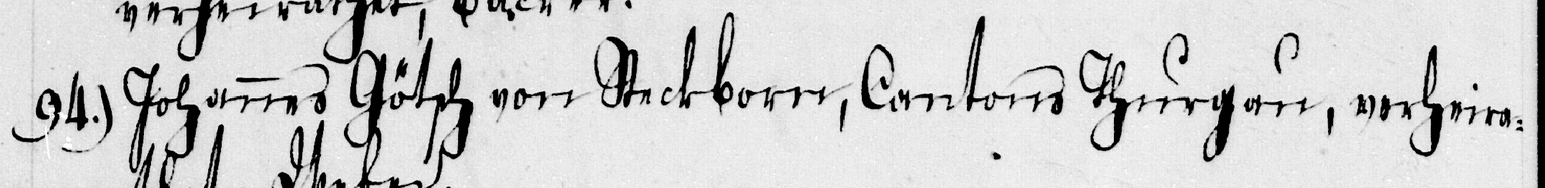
94.) Johannes Götsch von Steckborn, Cantons Thurgau, verheira¬
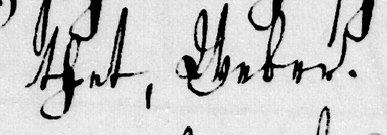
thet, Weber.
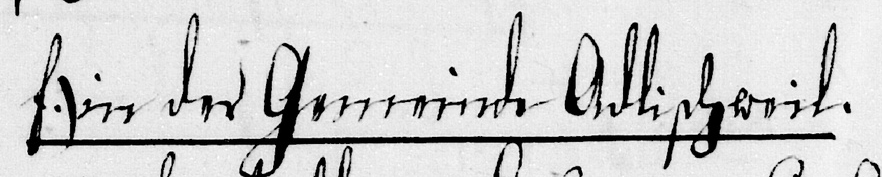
in der Gemeinde Adlischweil.
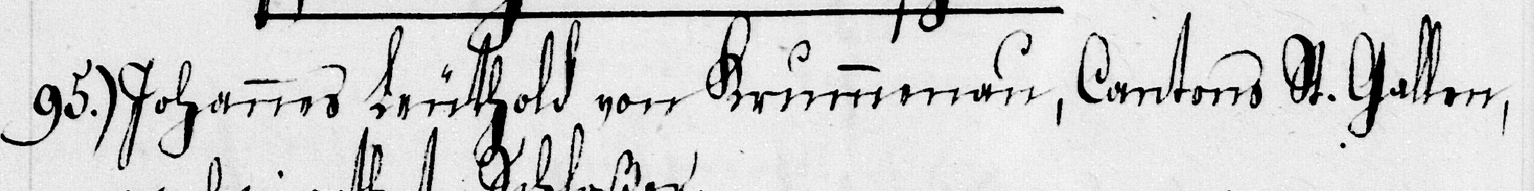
95.) Johannes Leuthold von Brummenau, Cantons St. Gallen,
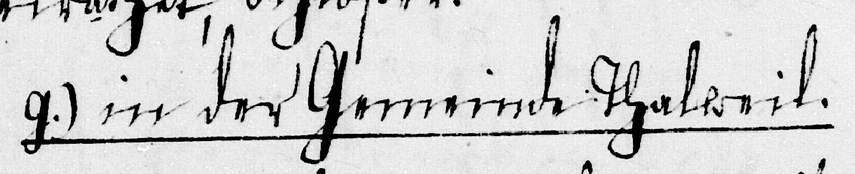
g.) in der Gemeinde Thalweil.
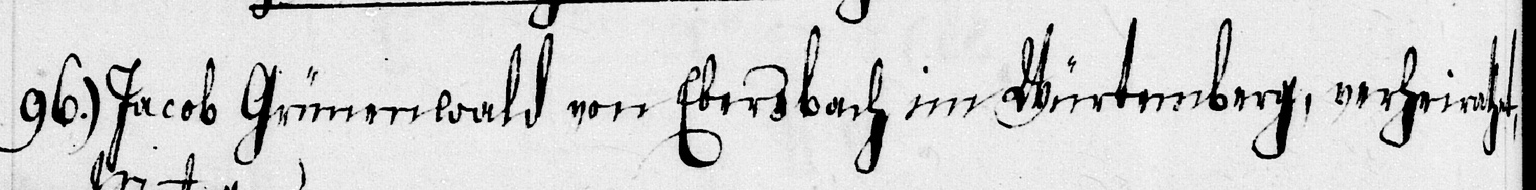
96.) Jacob Grünenwald von Ebersbach im Würtemberg, verheirath¬
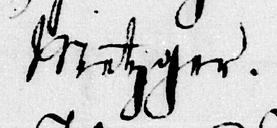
Metzger.
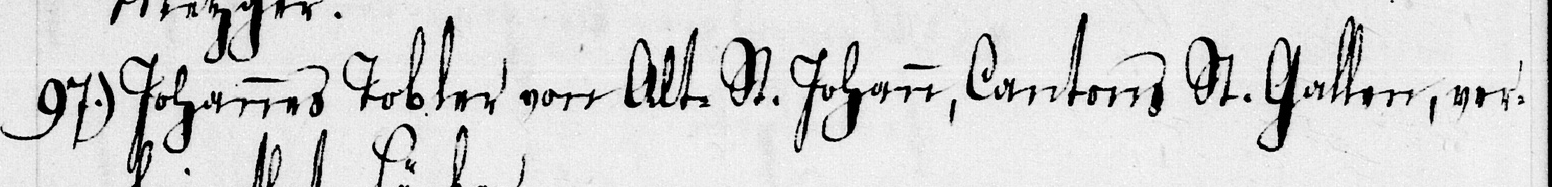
97.) Johannes Tobler von Alt-St. Johann, Cantons St. Gallen, ver¬
